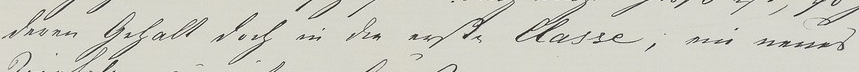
deren Gehalt doch in die erste Classe; ein neues
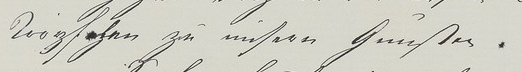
Tröpfchen zu unsern Gunsten.
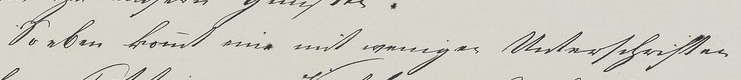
So eben kommt eine mit wenigen Unterschriften
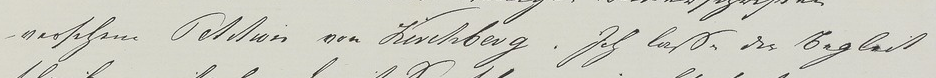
versehene Petition von Kirchberg. Ich lasse die Begleit-
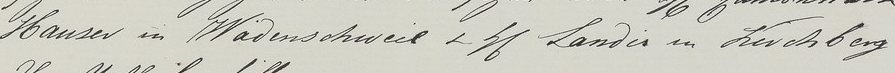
Hauser in Wädenschweil & Herr Landis in Kirchberg
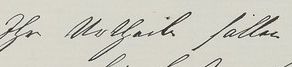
Ihre Urtheile fällen.
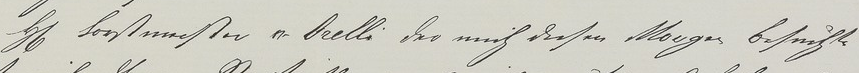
Herr Forstmeister v. Orelli der mich diesen Morgen besuchte
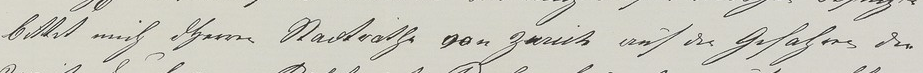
bittet mich d Herren Stadträthe von Zürich auf die Gefahren die
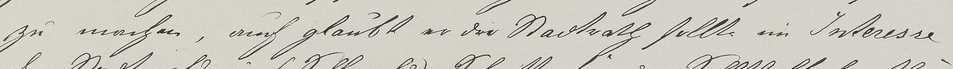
zu machen, auch glaubt er der Stadtrath sollte im Interesse
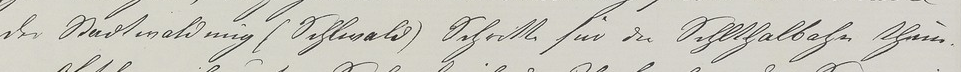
der Stadtwaldung (Sihlwald) Schritte für die Sihlthalbahn thun.
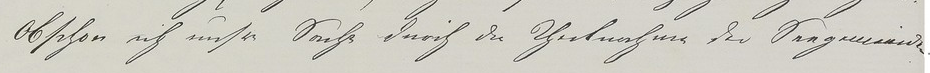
Obschon ich unsre Sache durch die Theilnahme der Seegemeinden
